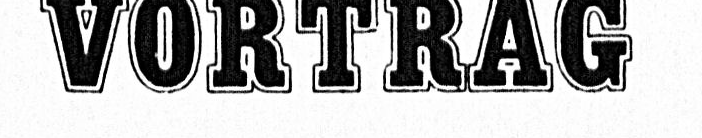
VORTRAG
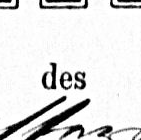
des
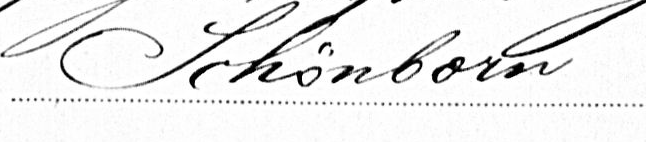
Schönborn
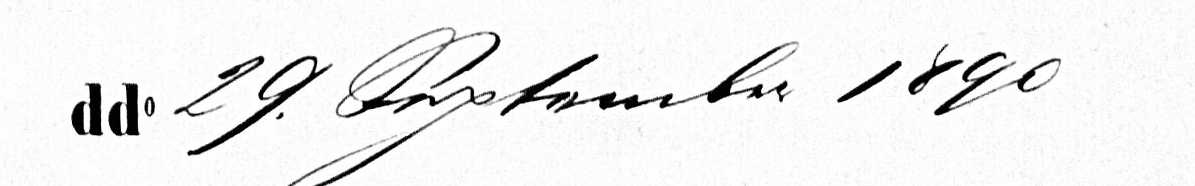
dd° 29. September 1890
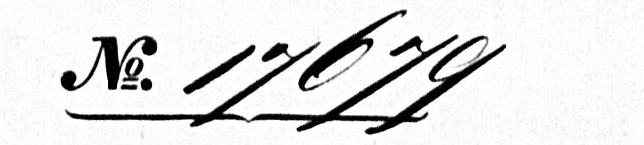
N° 17679
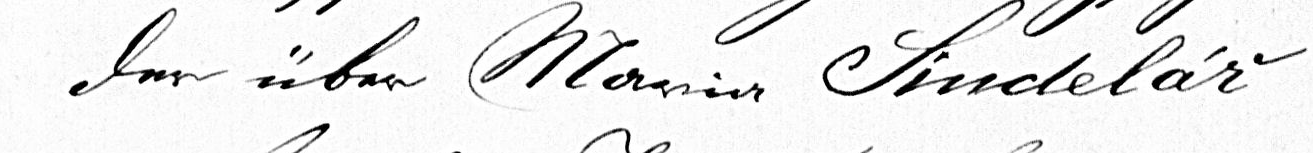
der über Maria Šindelář
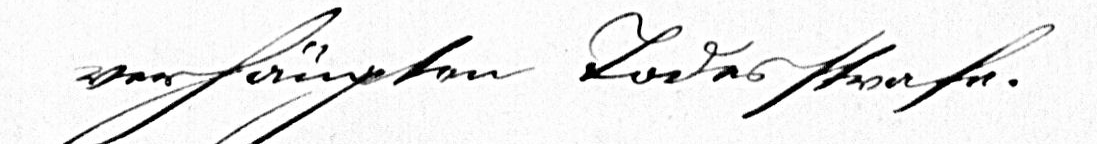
verhängten Todesstrafe.
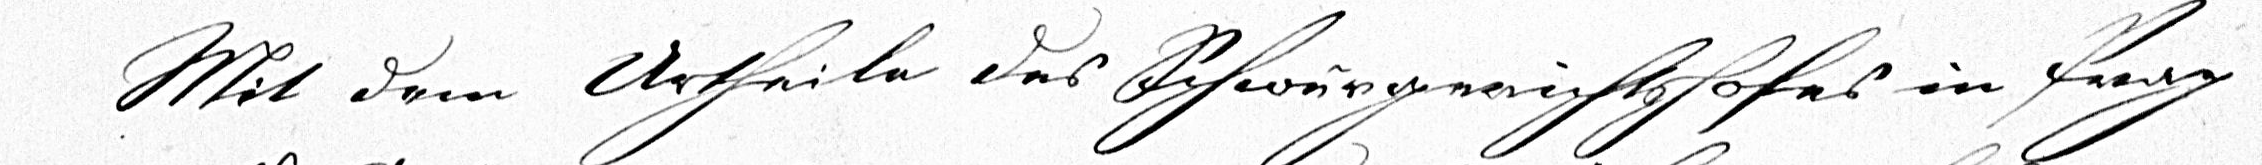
Mit dem Urtheile des Schwurgerichtshofes in Prag
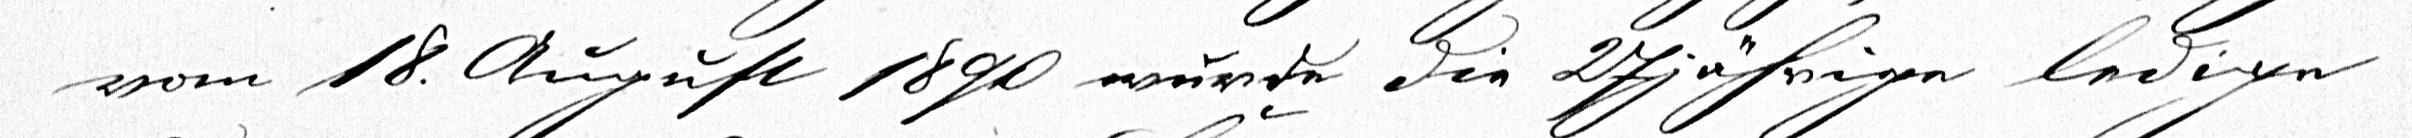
vom 18. August 1890 wurde die 27jährige ledige
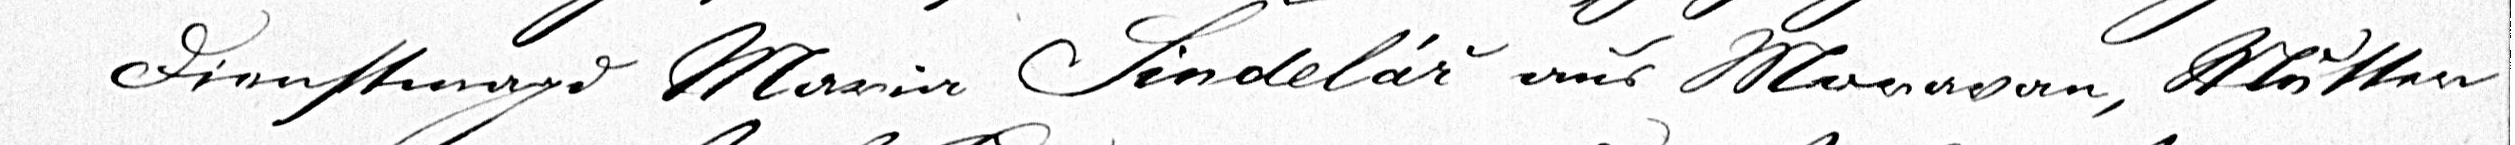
Dienstmagd Maria Šindelář aus Moravan, Mutter
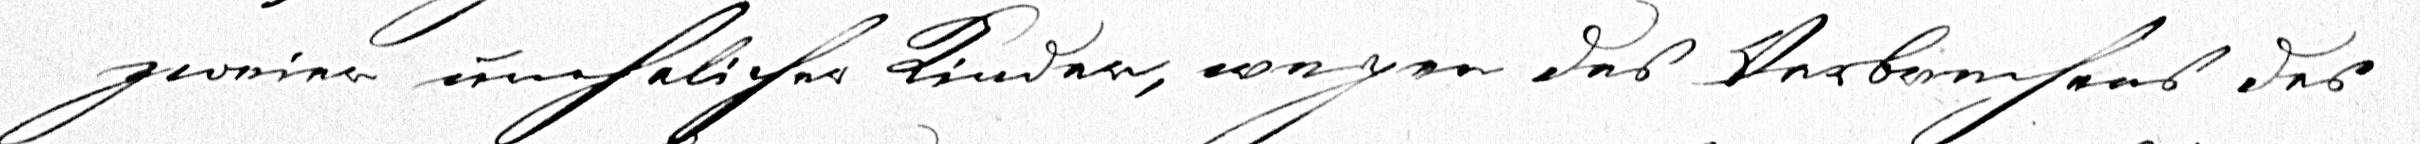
zweier unehelicher Kinder, wegen des Verbrechens des
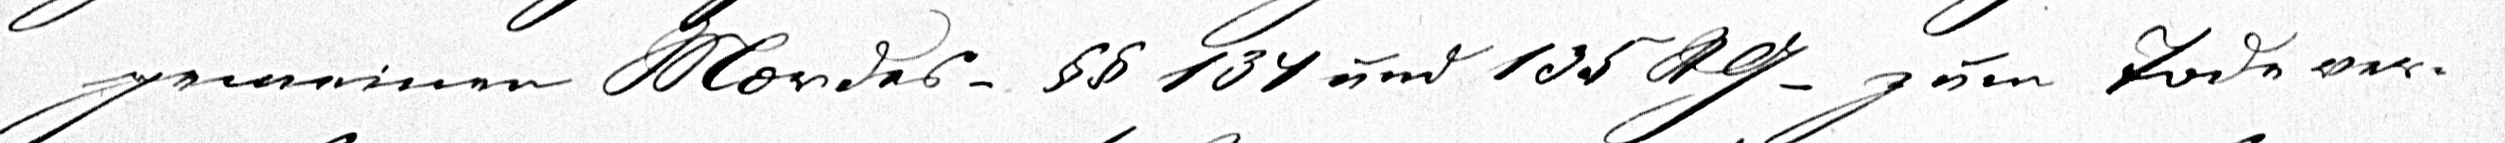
gemeinen Mordes - §§ 134 und 135 xxG- zum Tode ver¬
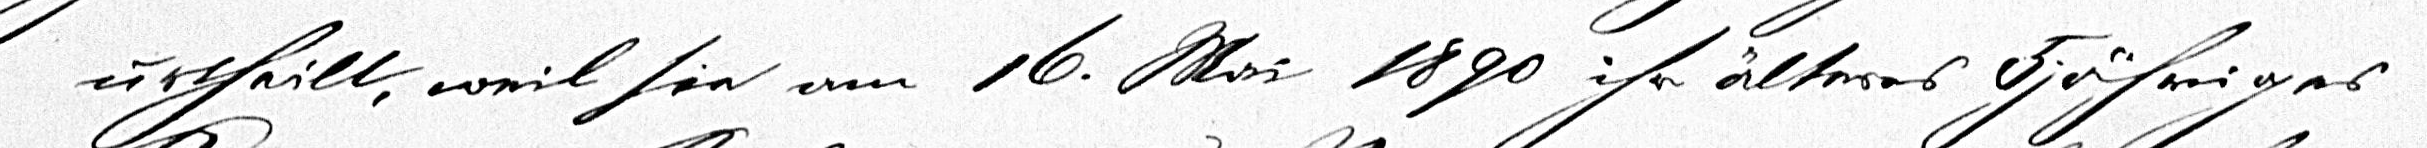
urtheilt, weil sie am 16. Mai 1890 ihr älteres 5jähriges
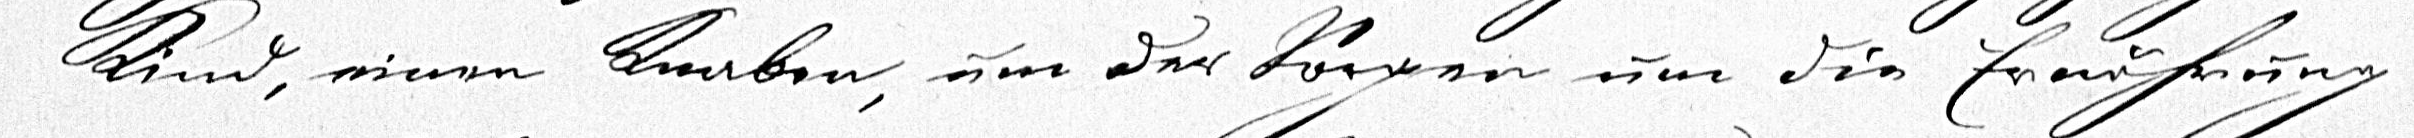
Kind, einen Knaben, um der Sorgen um die Ernährung
